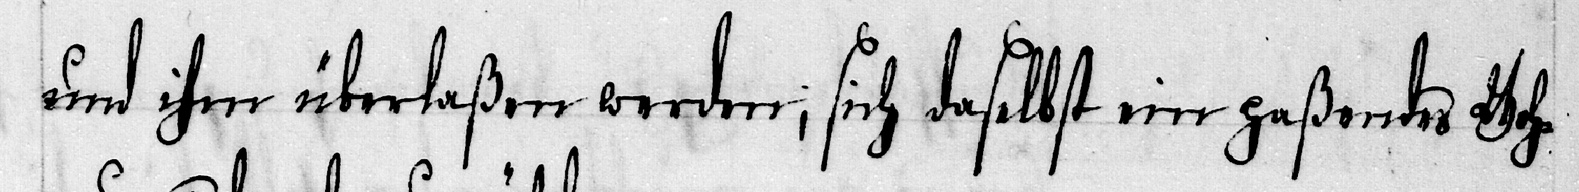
und ihm überlaßen werden; sich daselbst ein paßendes Woh¬
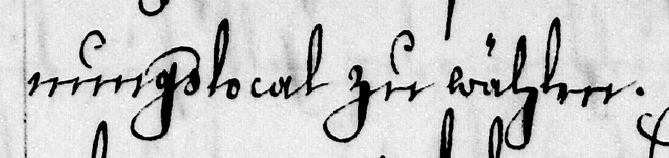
nungslocal zu wählen.
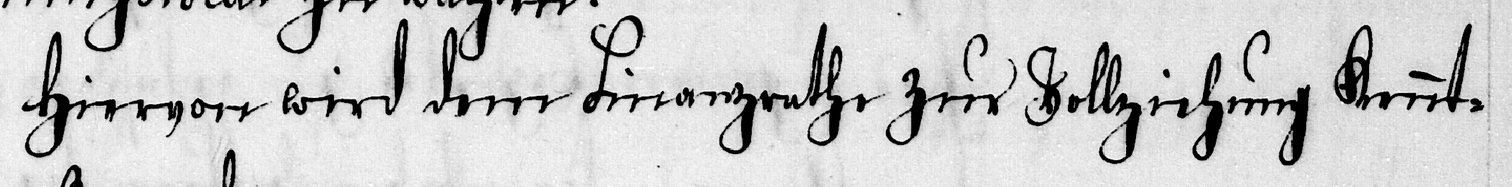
Hiervon wird dem Finanzrathe zur Vollziehung Kennt¬
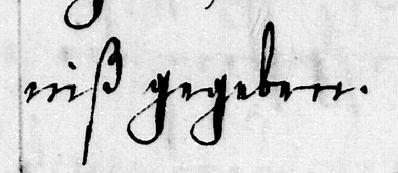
niß gegeben.
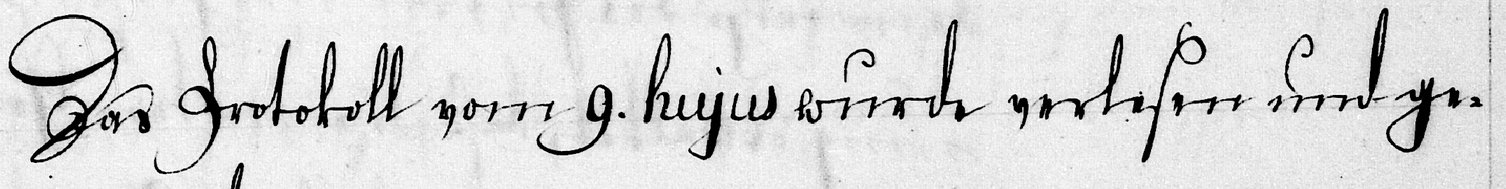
Das Protokoll vom 9. hujus wurde verlesen und ge¬
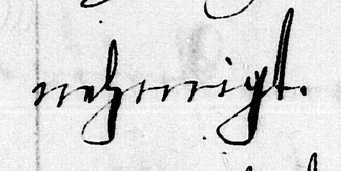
nehmigt.
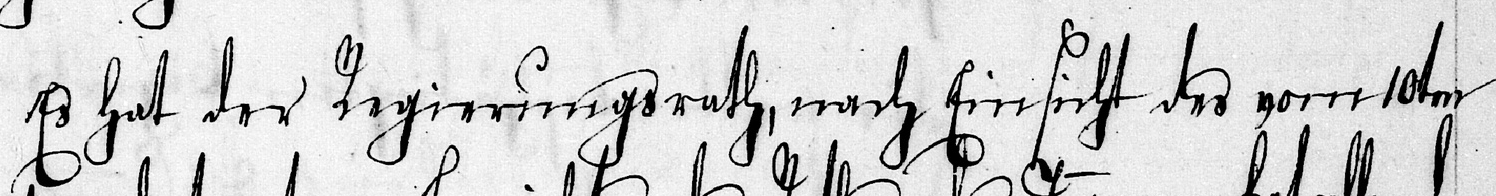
Es hat der Regierungsrath, nach Einsicht des vom 10ten
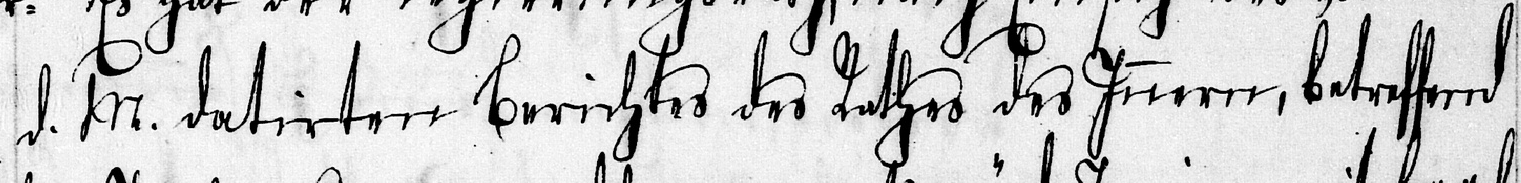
d. M. datirten Berichtes des Rathes des Innern, betreffend
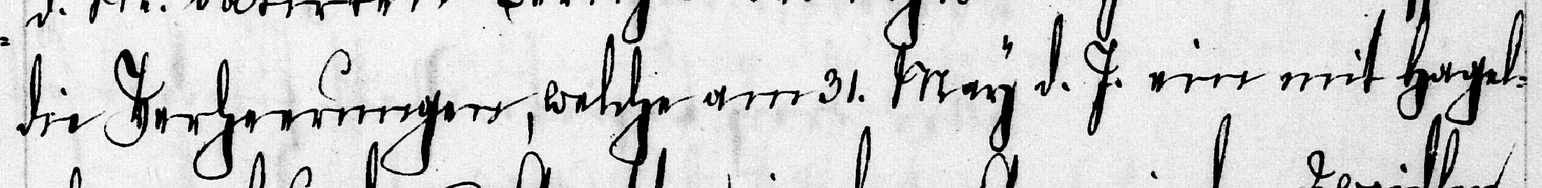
die Verheerungen, welche am 31. May d. J. ein mit Hagel¬
